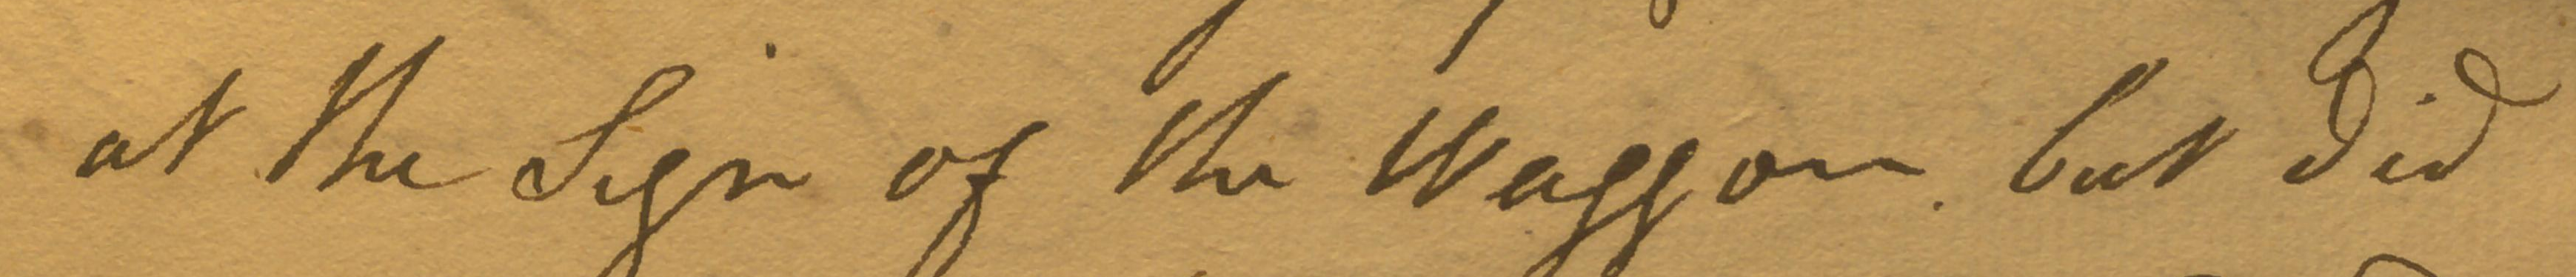at the Sign of the Waggon but did
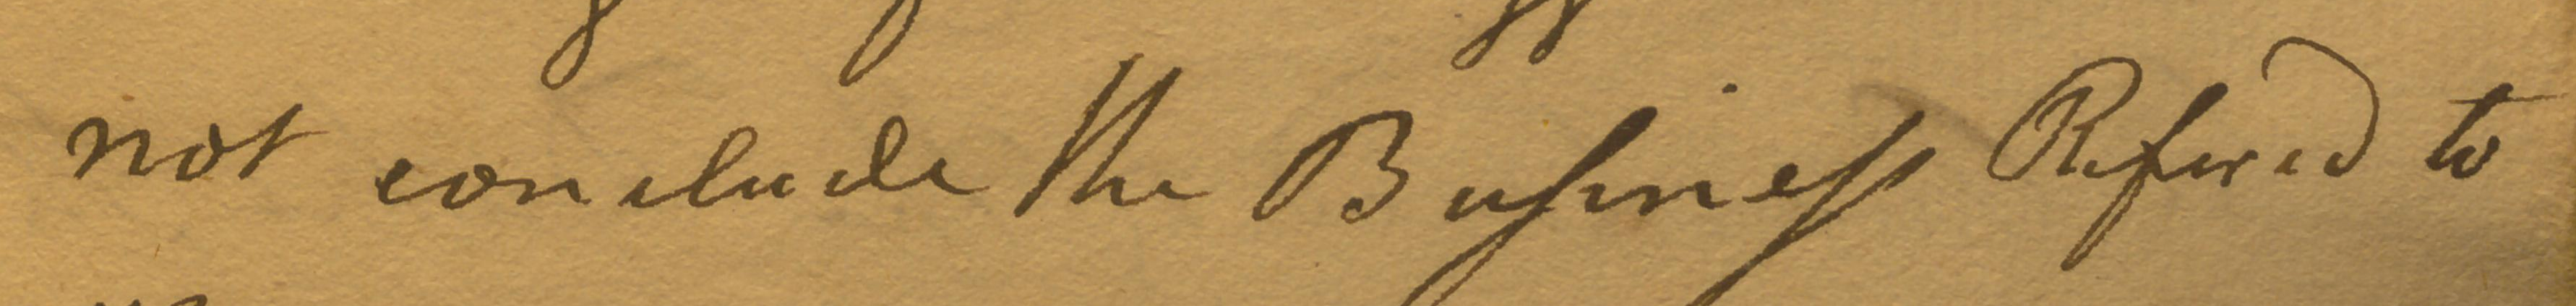not conclude the Business Refered to
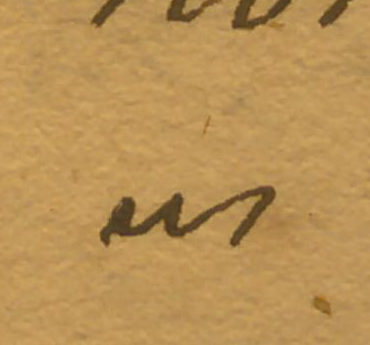us
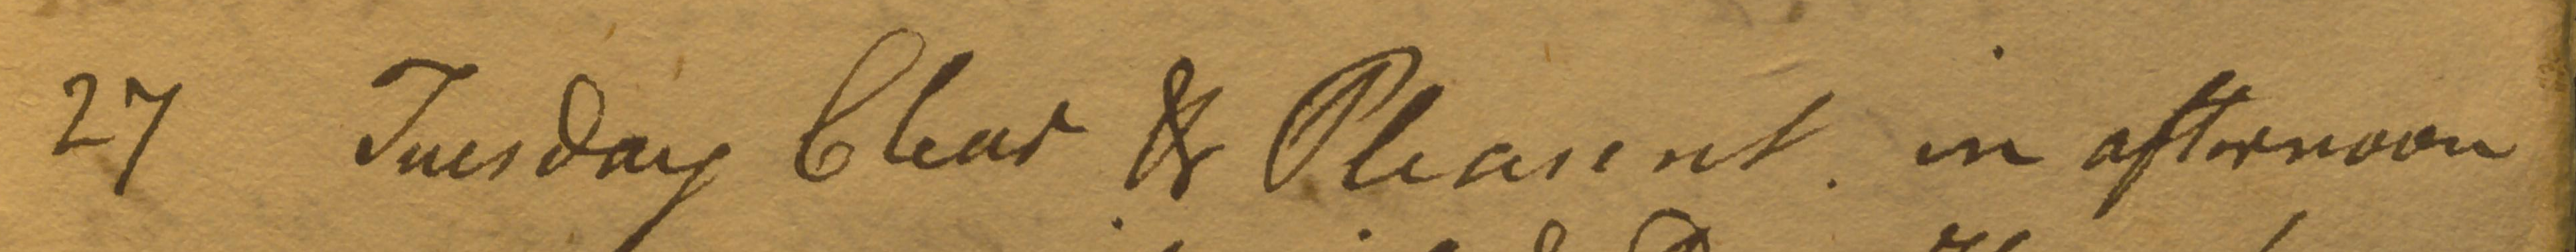27 Tuesday Clear & Pleasent in afternoon
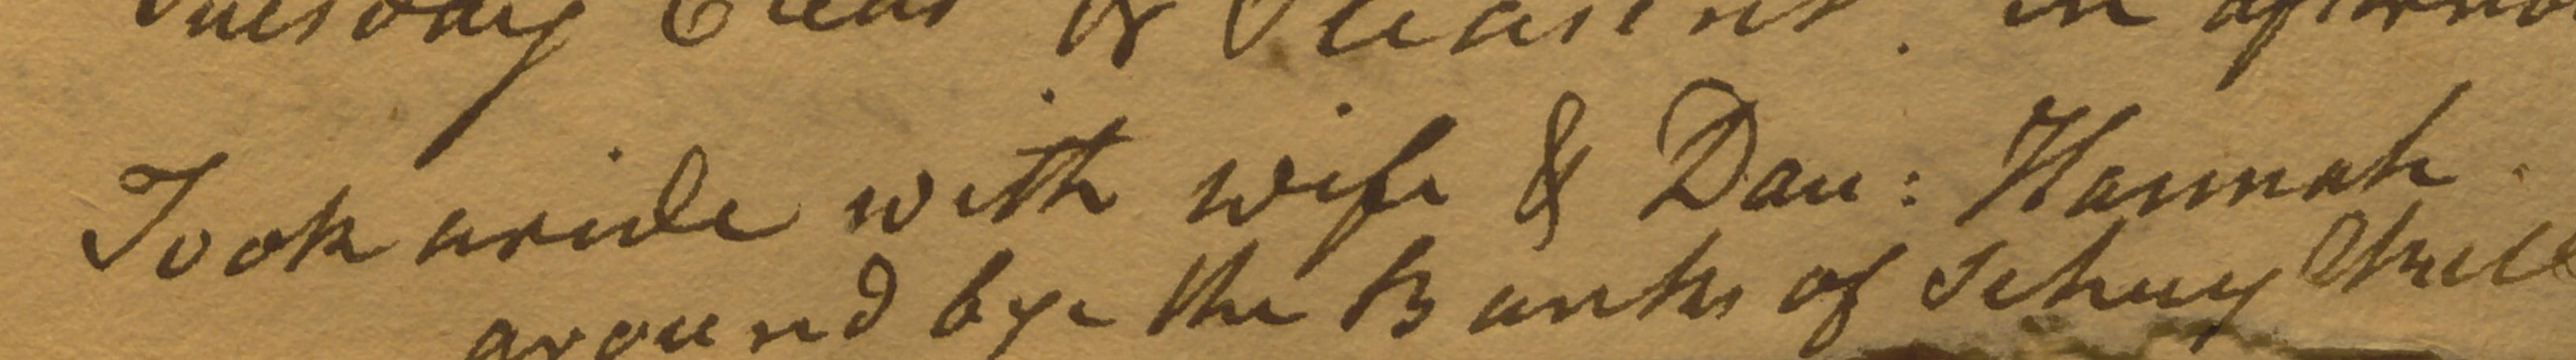Took a ride with wife & Dau: Hannnah
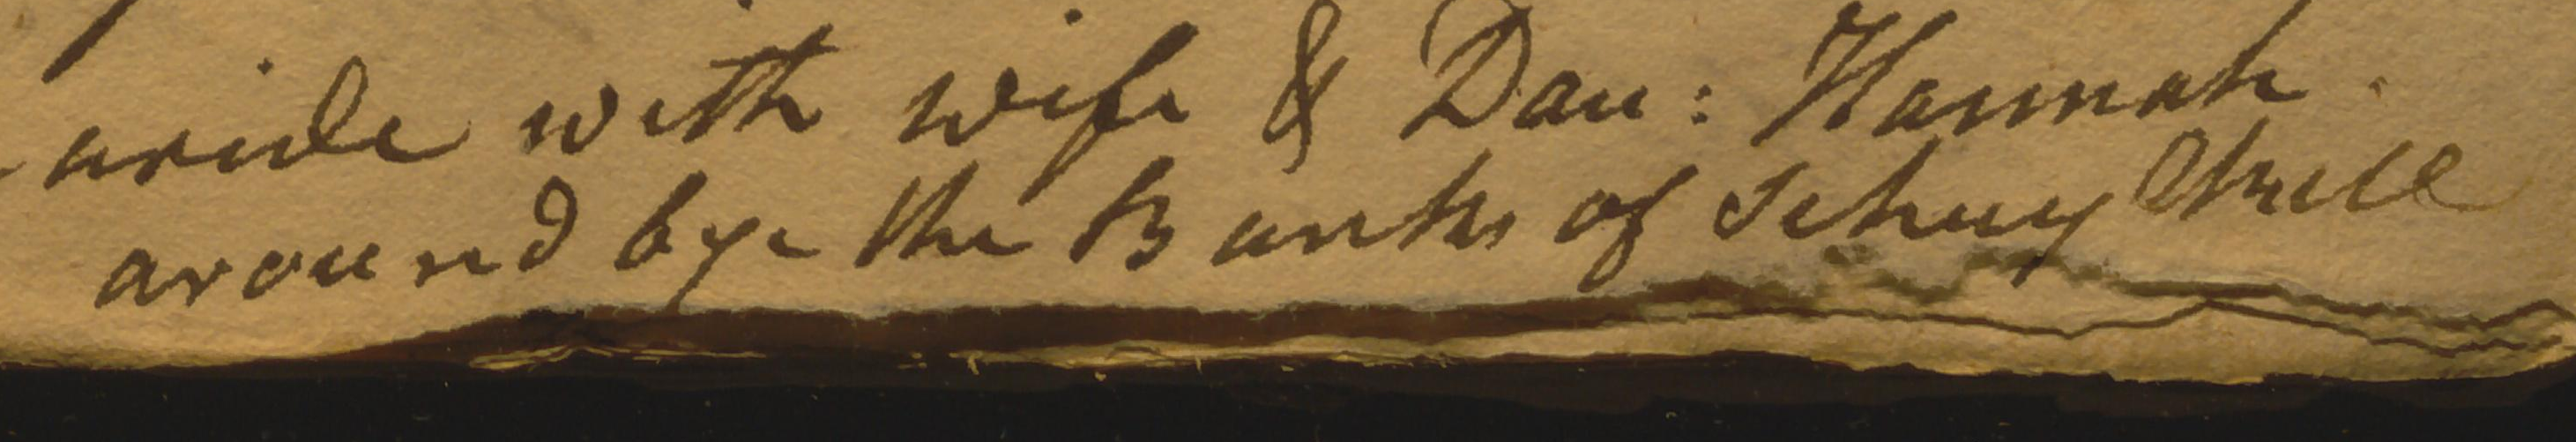around bye the Banks of Schuylkill
